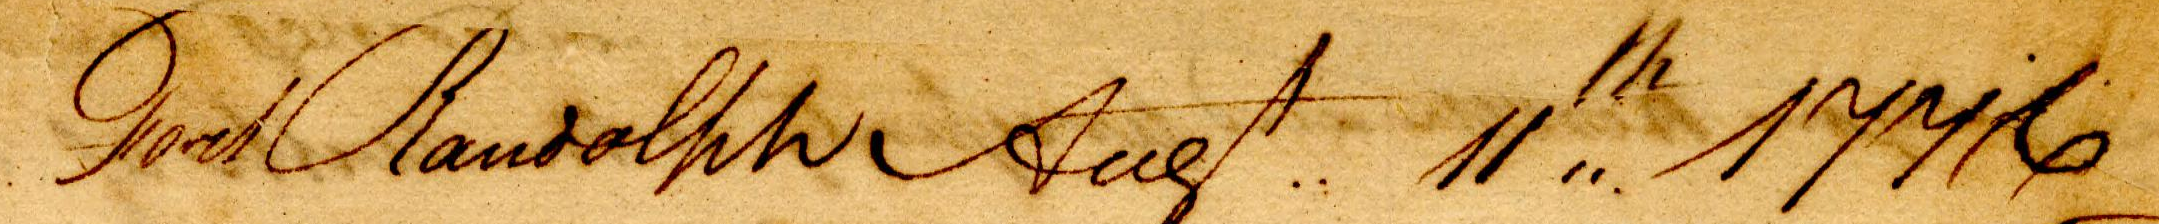Fort Randolph Aug^t. 11^th. 1776
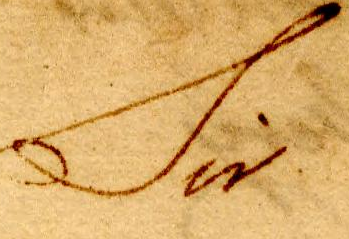Sir
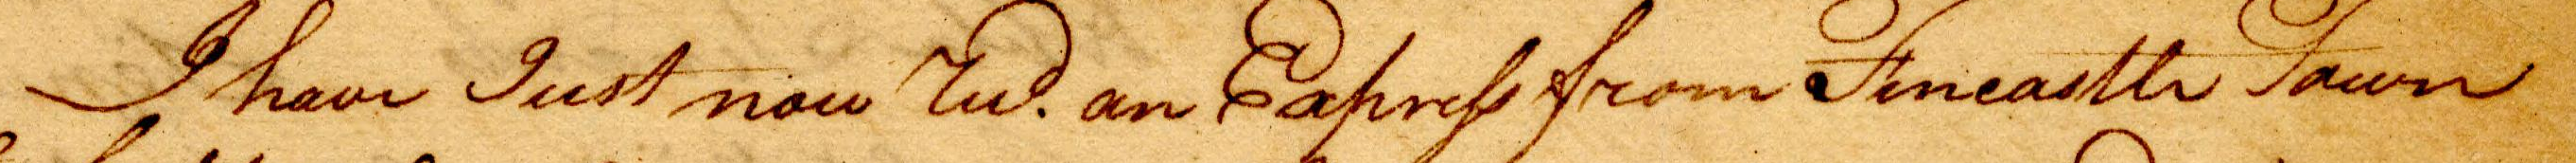I have Just now rec^d. an Express from Fincastle Town
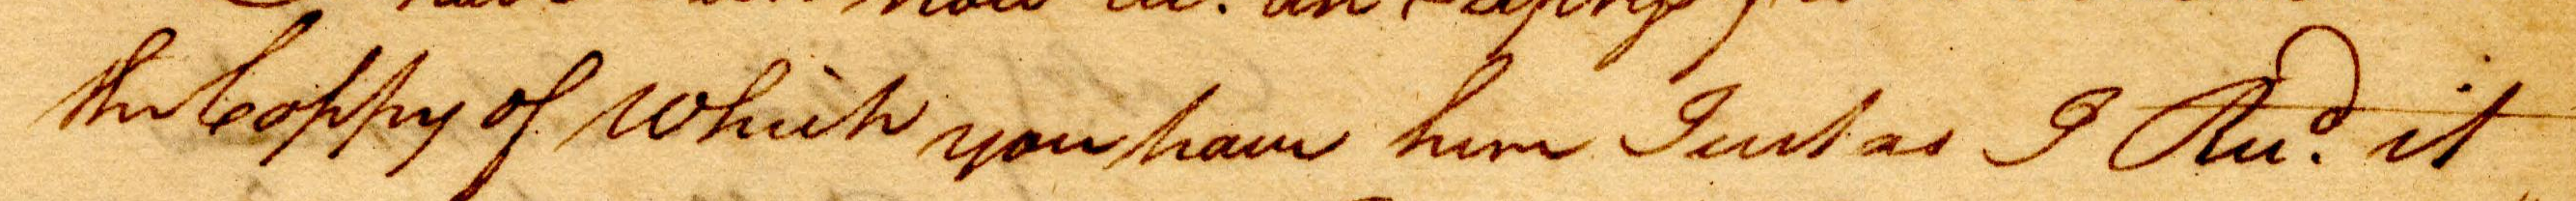the Coppy of Which you have here Just as I Rec^d. it
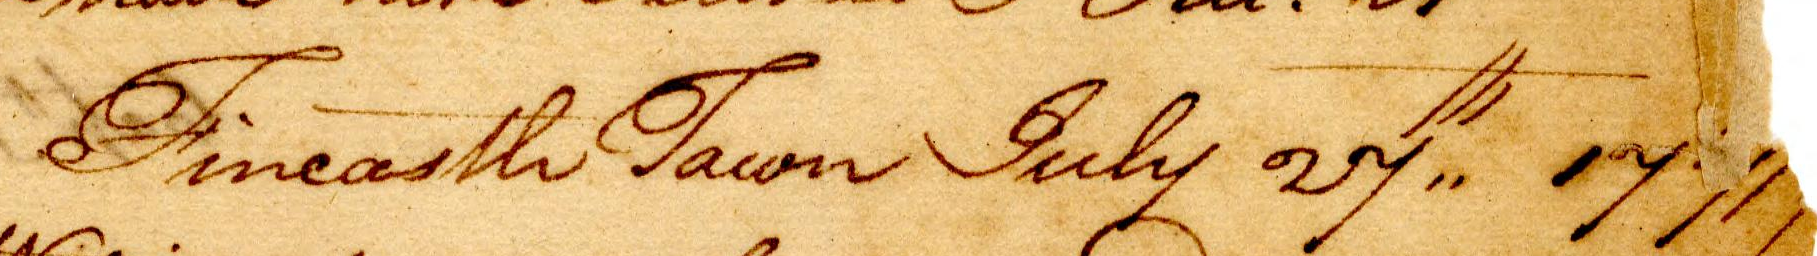Fincastle Town July 27^th. 177
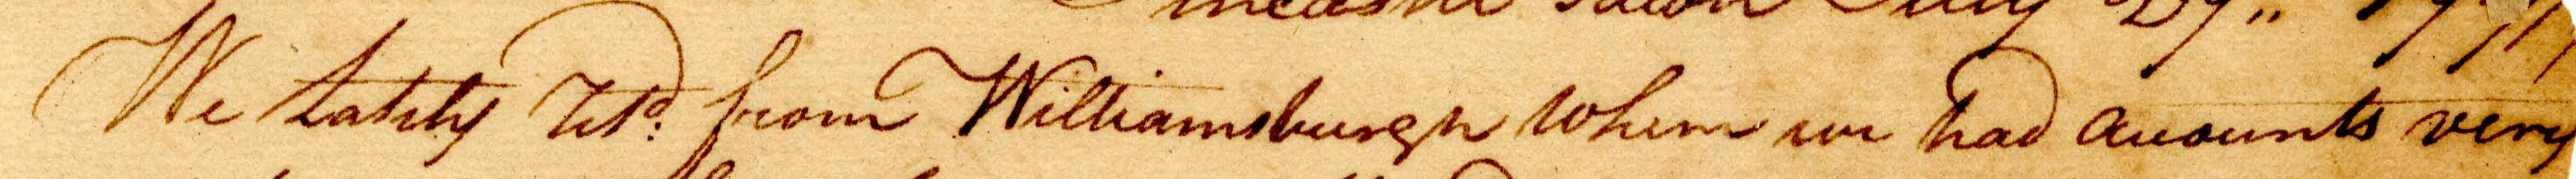We latety ret^d. from Williamsburg when we had accounts very
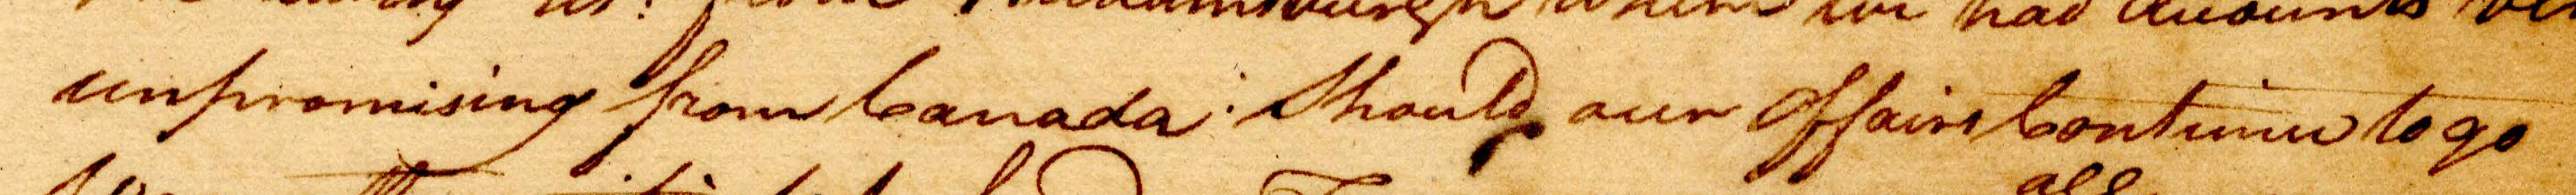unpromising pour Canada: Should our Affairs Continue to go
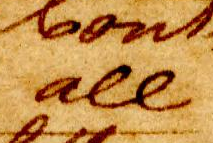all
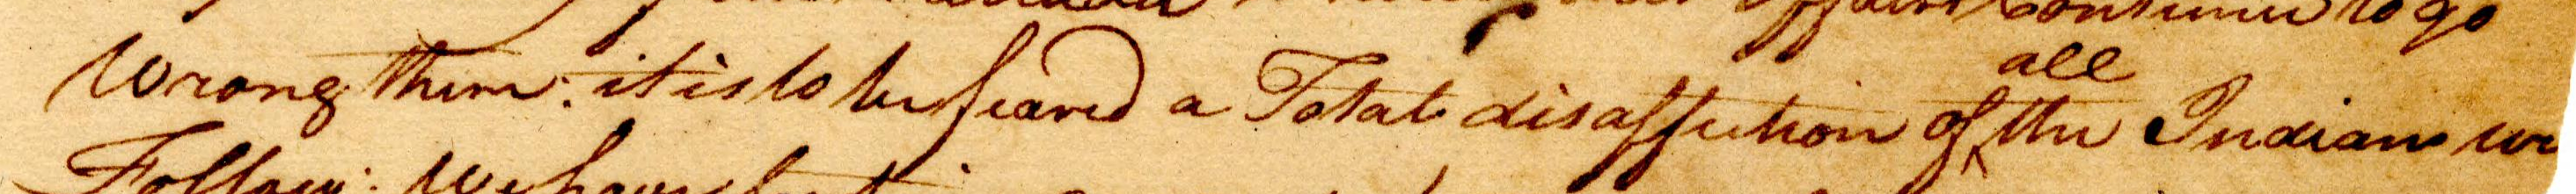Wrong there: it is to be feared a Total disaffection of ^ the Indians can
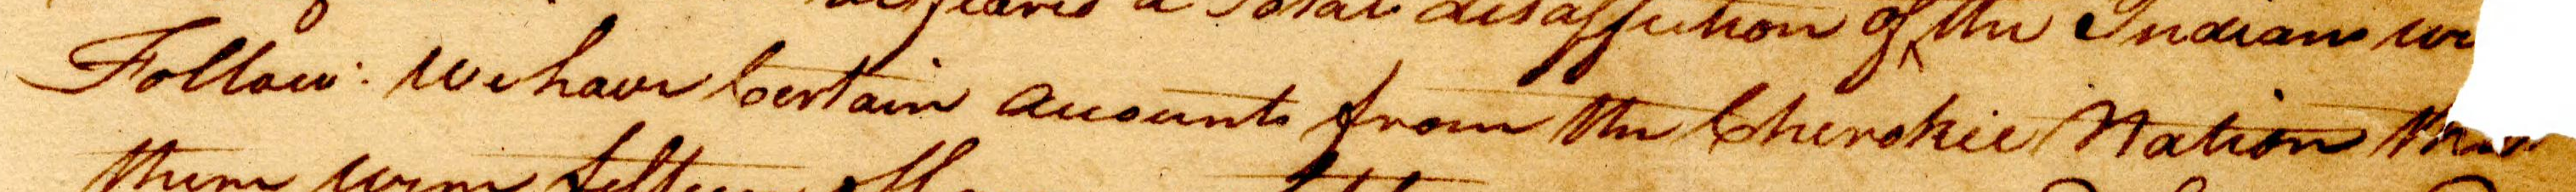Follow: We have Certain accounts from the Cherokie Nation that
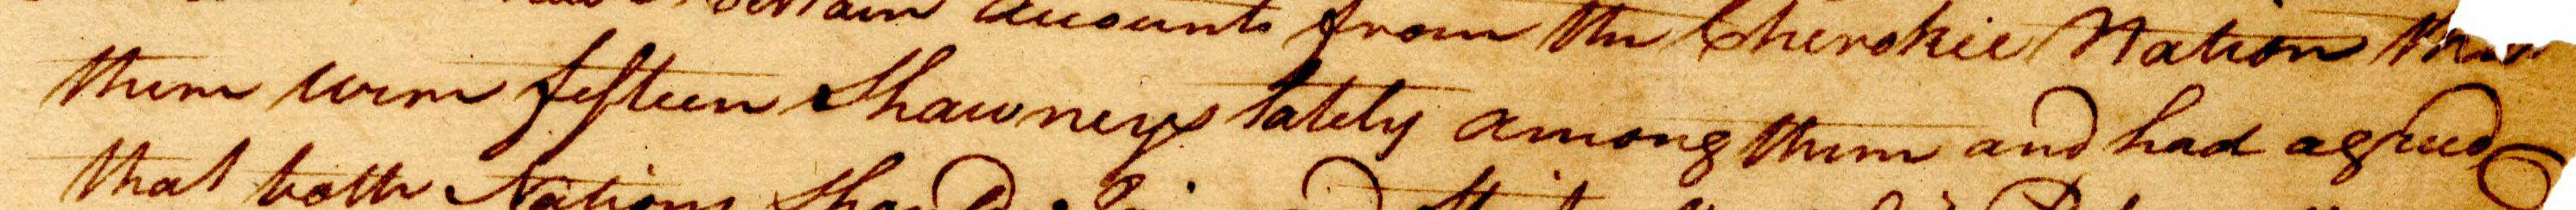there were fifteen Shawneys lately among them and had agreed
